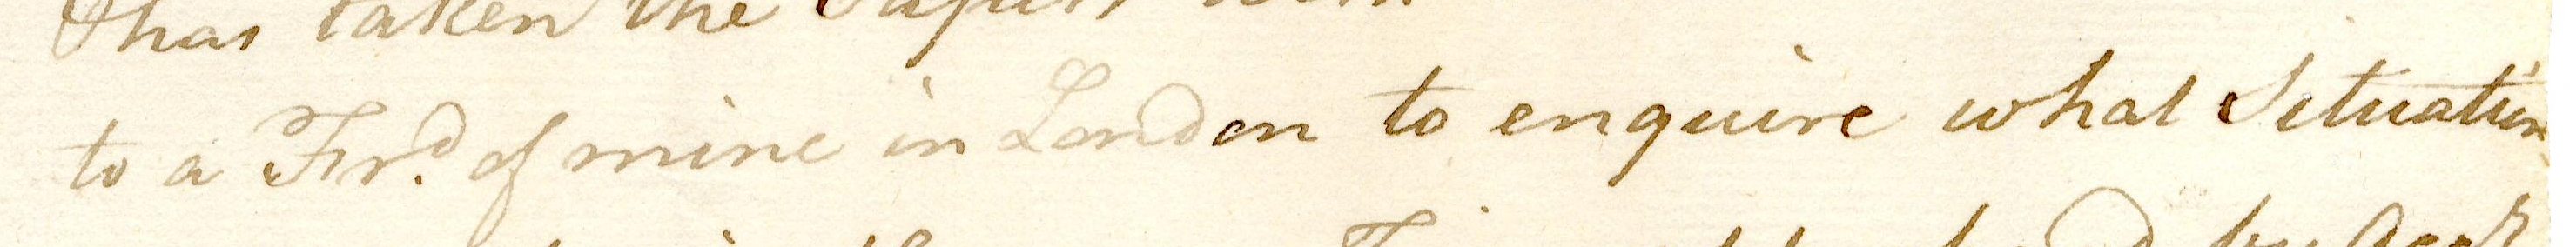to a Fr^d. of mine in London to enquire what Situation
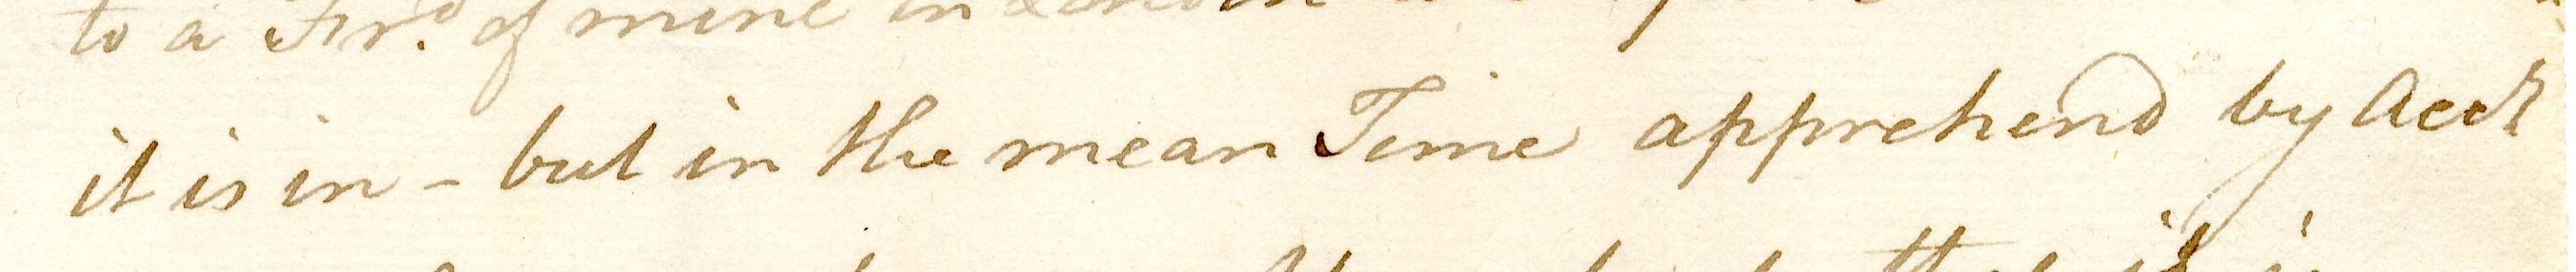it is in- but in the mean Time apprehend by Acc^t.
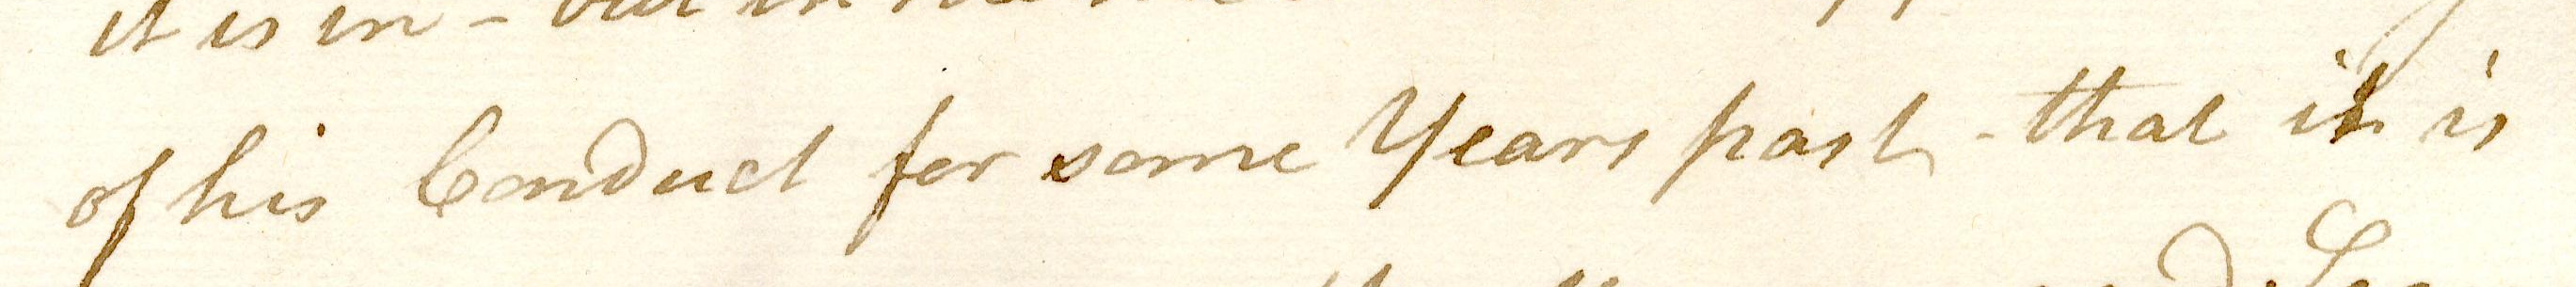of his Conduct for some Years past that it is
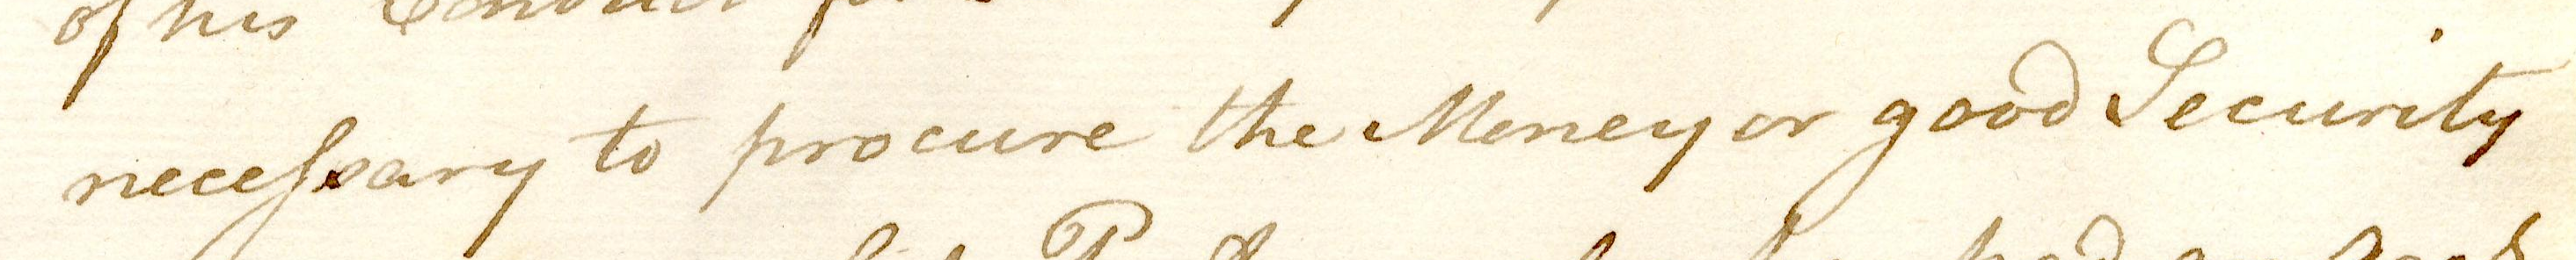necessary to procure the Money or good Security
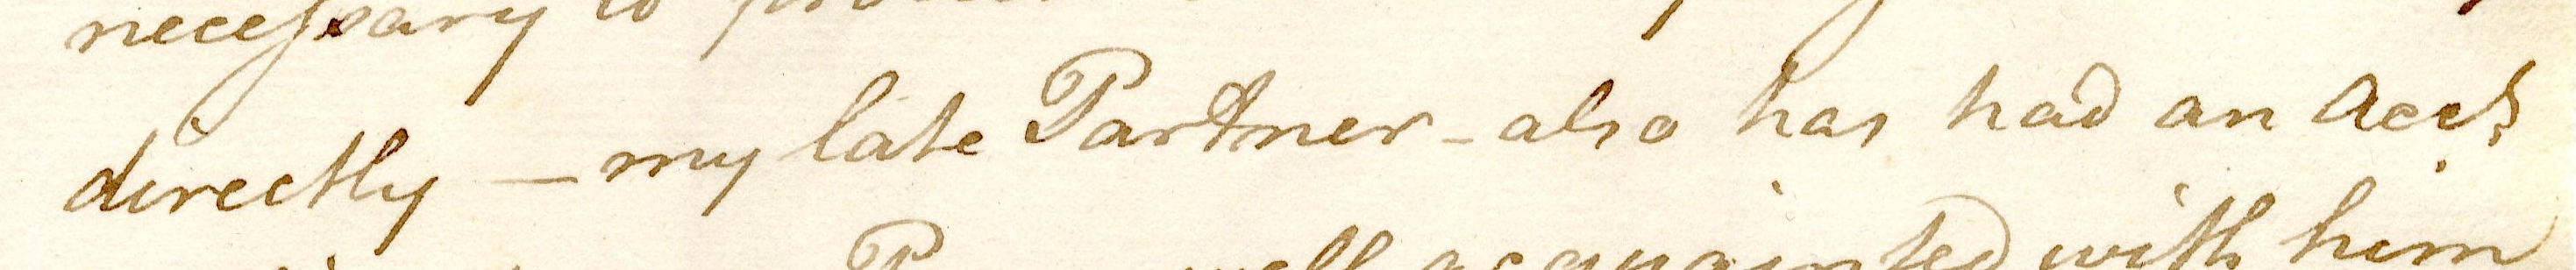directly- my late Partner also has had an Acc^t
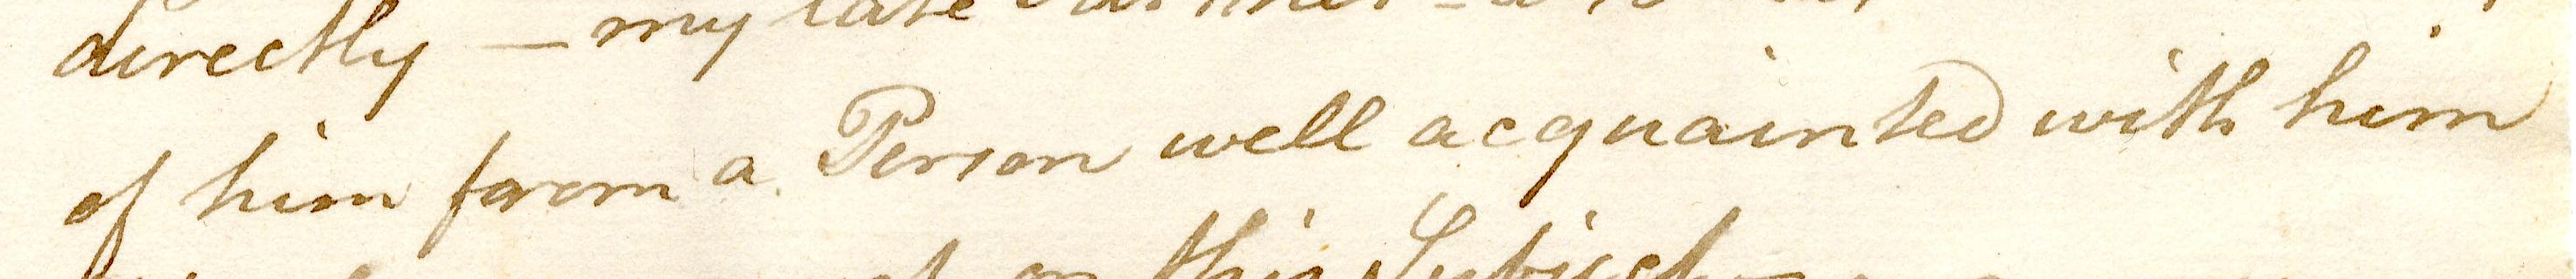of him from a Person well acquainted with him
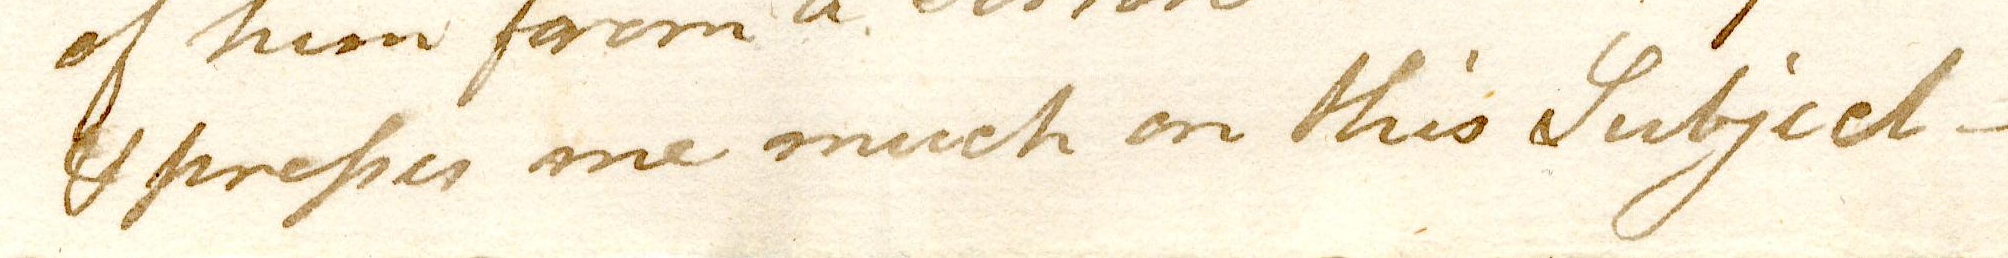& presses me much on this Subject
